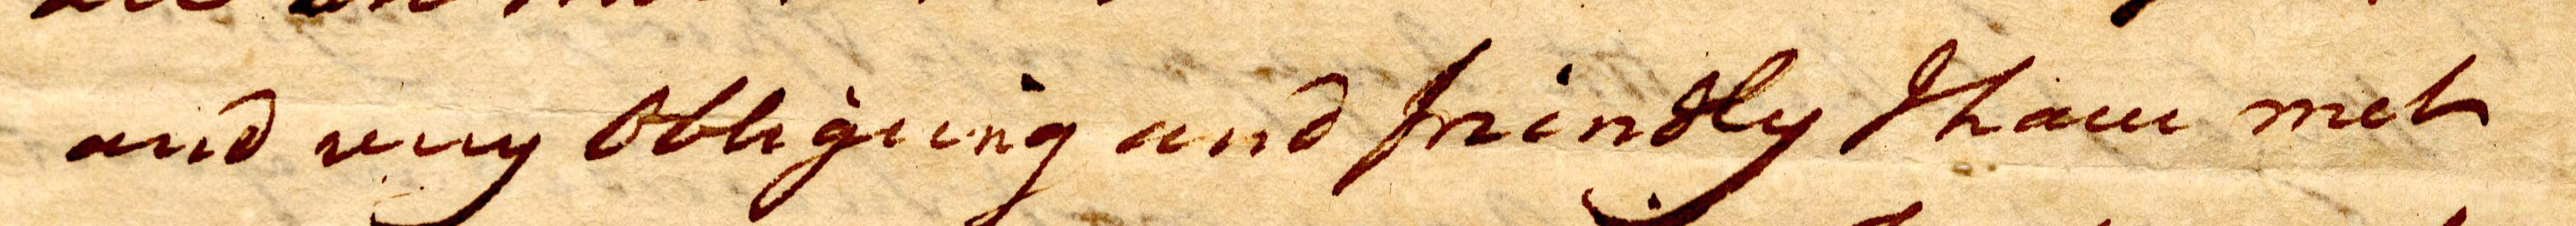and very Obliging and friendly I have met
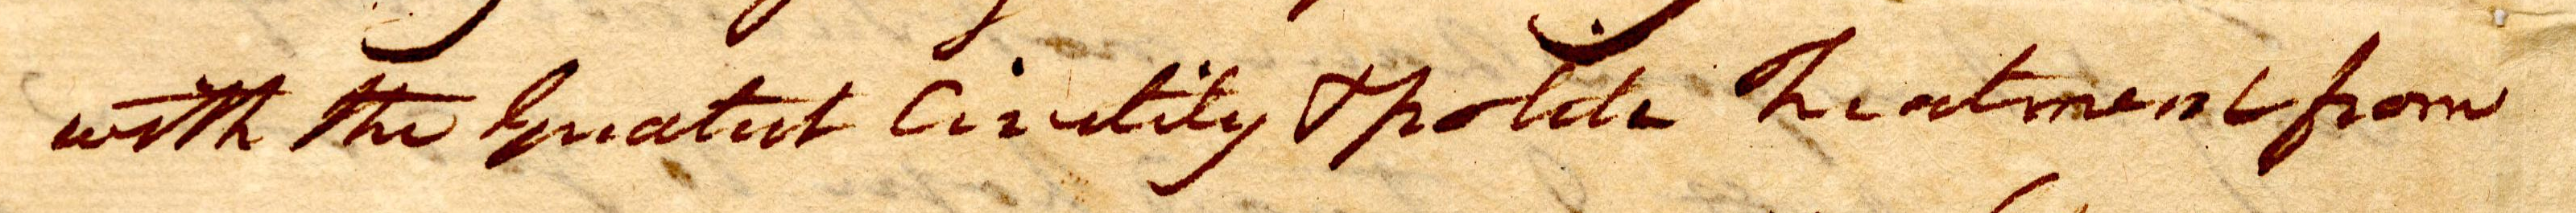with the Greatest Civility & polite Treatment from
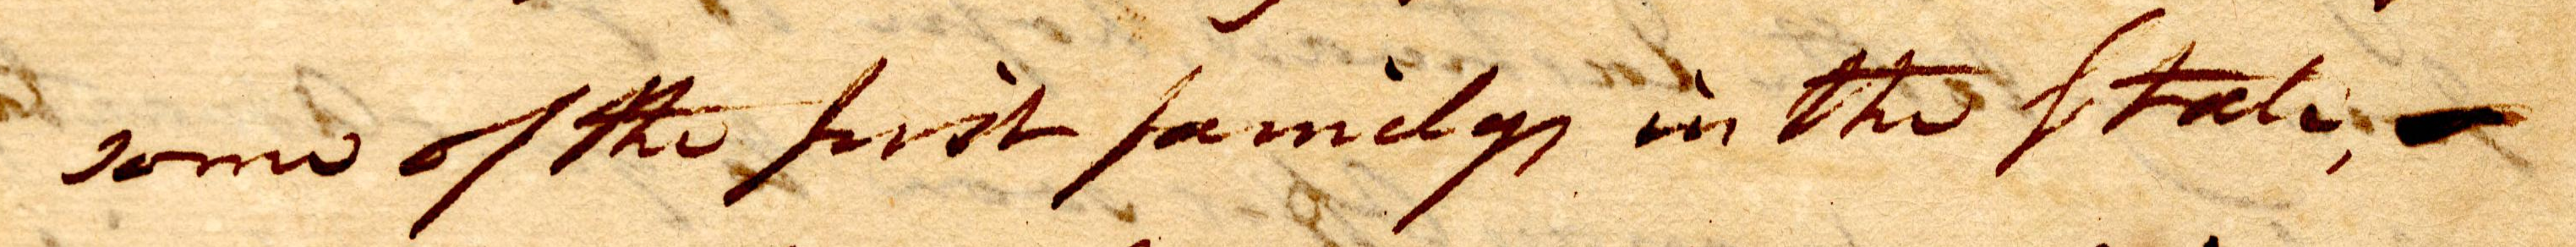some of the first familys in the State,-
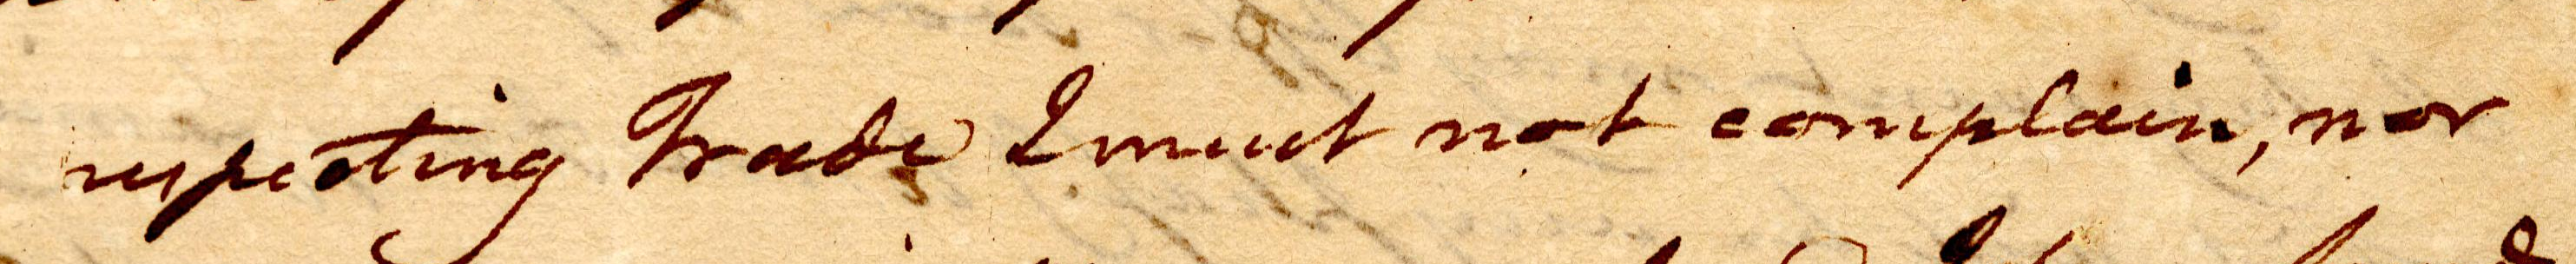respecting Trade I must not complain, nor
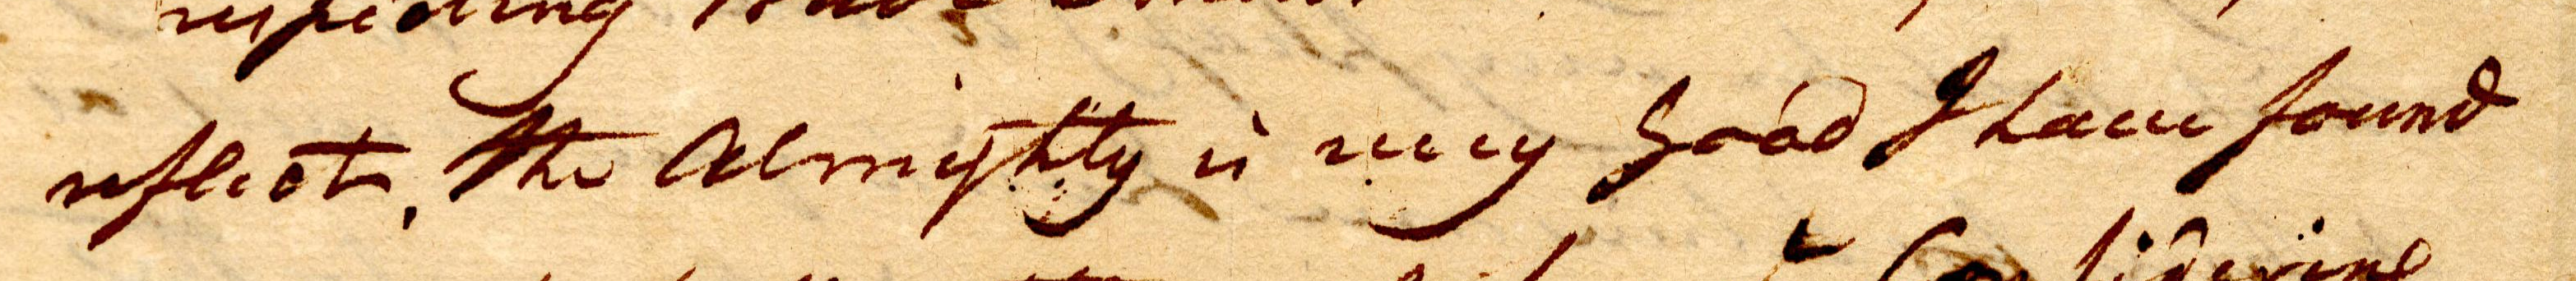reflect, the Almighty is very good I have found
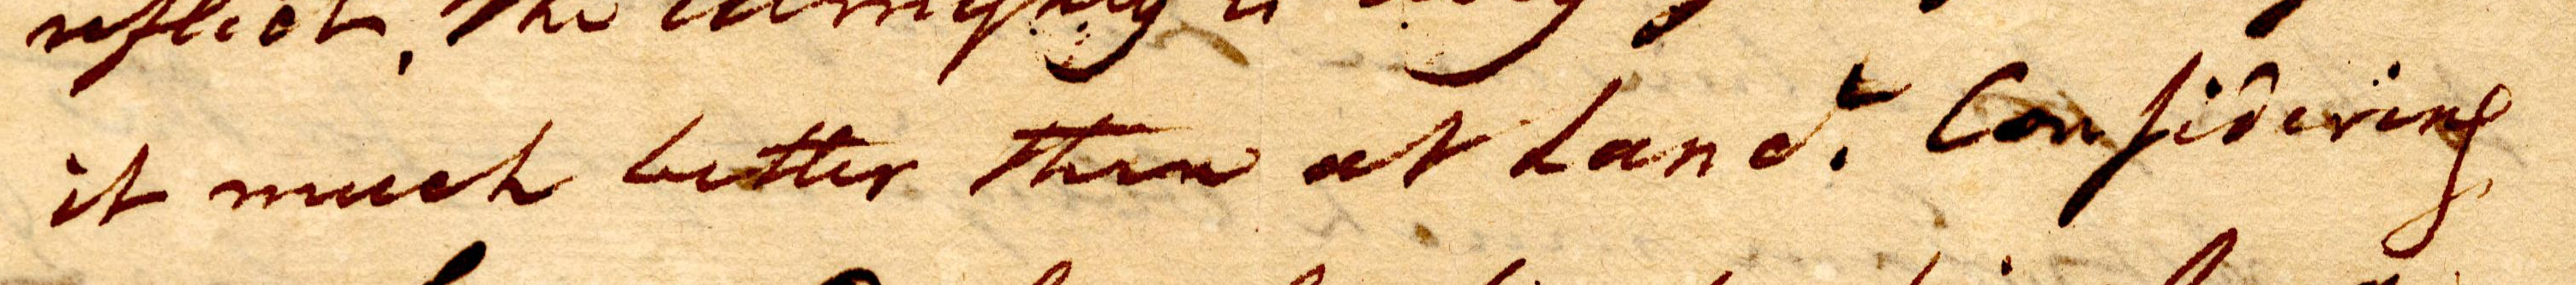it much better then at Lanc^r. Considering
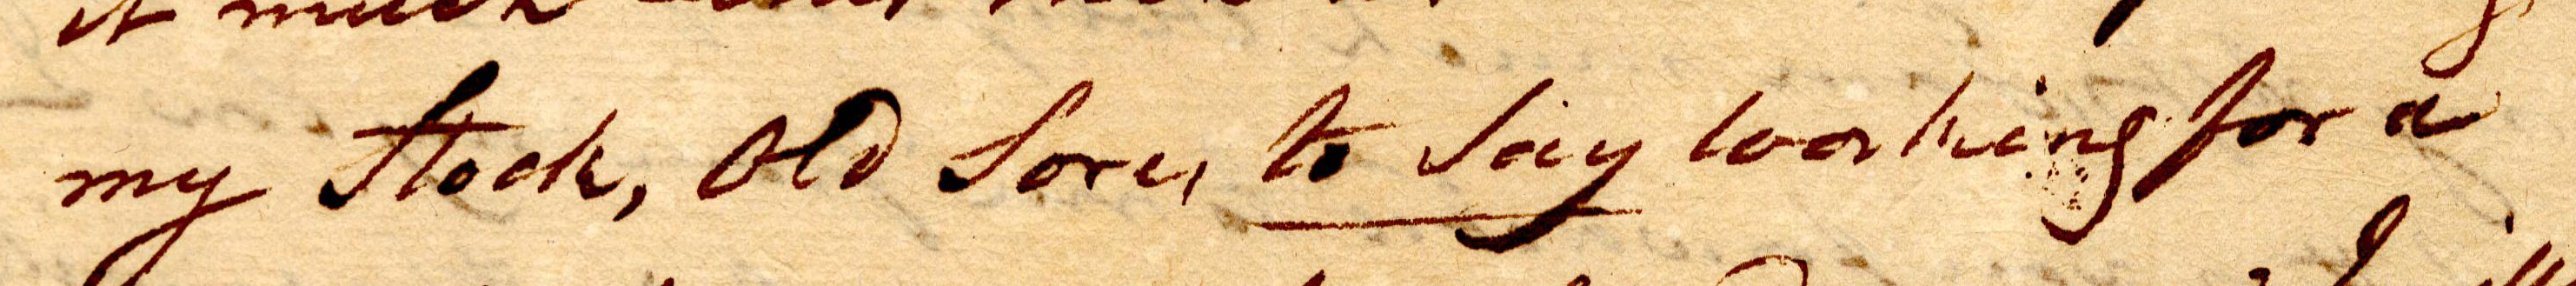my Stock, Old Sore, to say working for a
